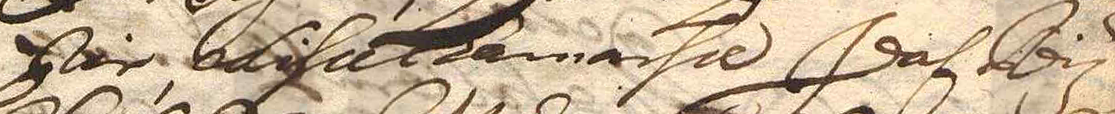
prir, e disse chamarsse Joaõ Roiz̄
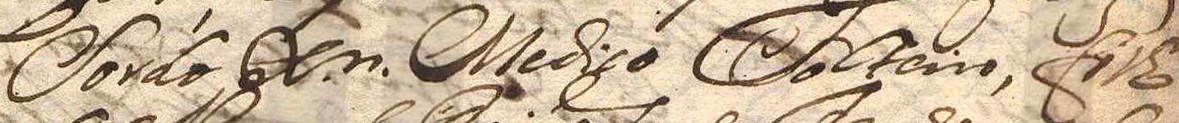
Sordo X. n. Medico solteiro, filho
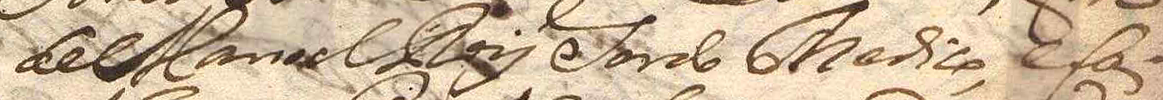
de Manoel Roiz̄ Sordo Medico, e Ca
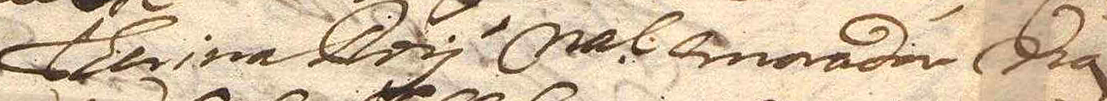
therina Roiz̄ na.l e morador na
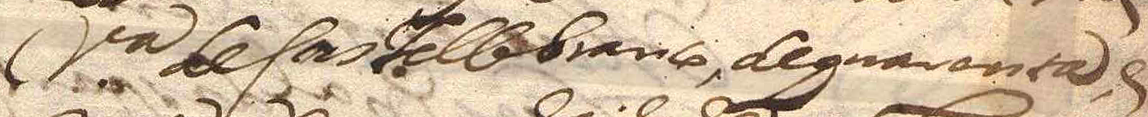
V.a de Castello branco, de quarenta, e
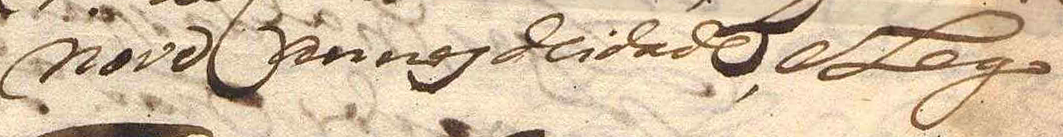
nove annos de idade, e Logo
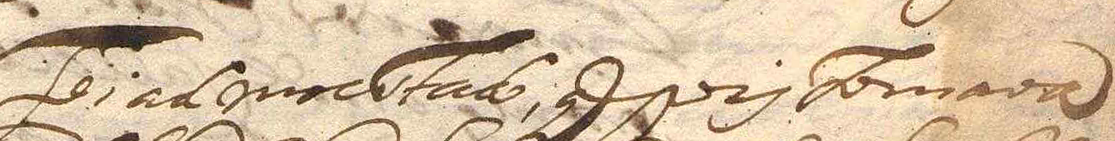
Foi admoestado, q̄ pois tomava
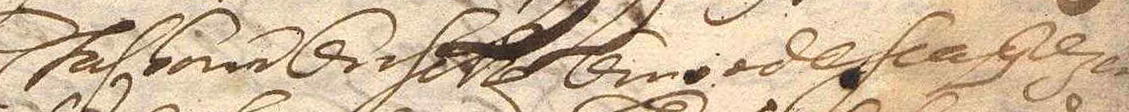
taõ bom Conselho Como o de se aprezen
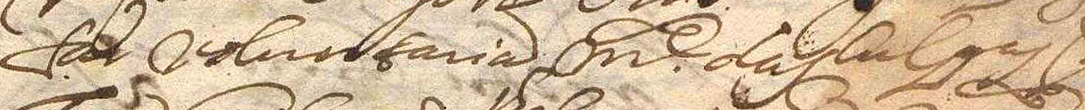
tar voluntariam.te das culpas q̄
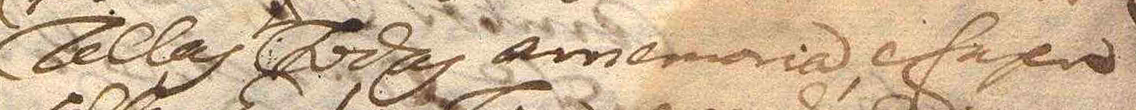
Zellas todas a memoria, e fazer
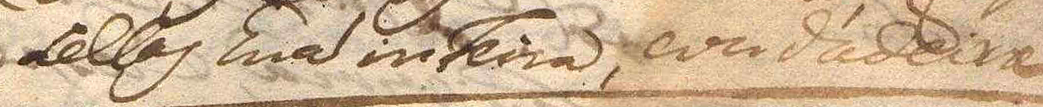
dellas huā inteira, e verdadeira
